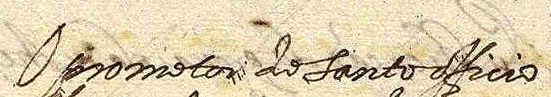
O promotor do santo officio
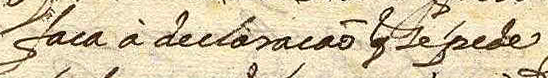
faça a declaraçaõ q̄ se pede
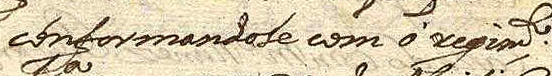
conformandose com o regimto.
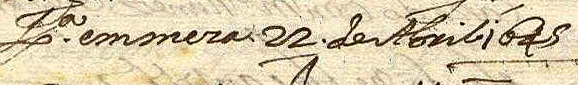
Lxa. em meza 22. de Abril i645
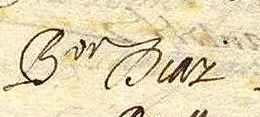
Bor Diaz
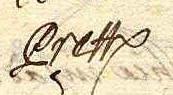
Pretto
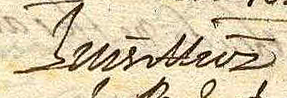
Luis Aluz̄
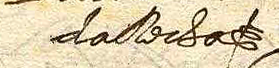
da Rocha
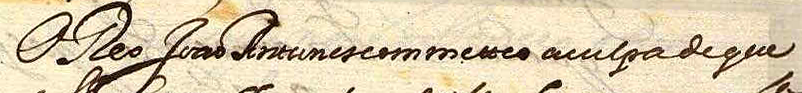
O Reo Joaõ Antunes commetteo a culpa de que
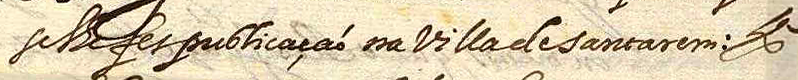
se lhe fes publicaçaõ na villa de santarem: Lxa
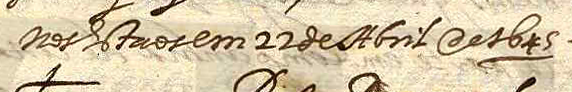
nos Estaos em 22 de Abril de 1645
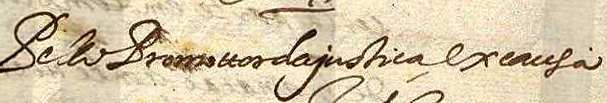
Pello Promottor da justiça, ex causa
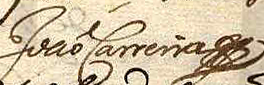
Joaõ Carreira
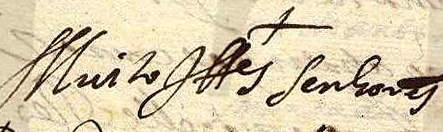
Muito Jlles Senhores
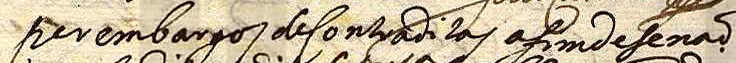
por embargos de Contraditas afim de se naõ
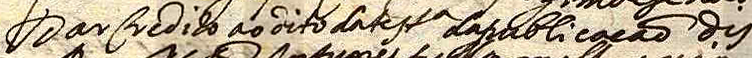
dar Credito ao dito da testa da publicaçaõ dis
